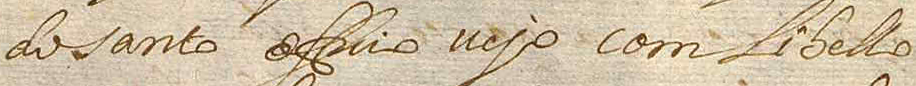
do santo officio uejo com Libello
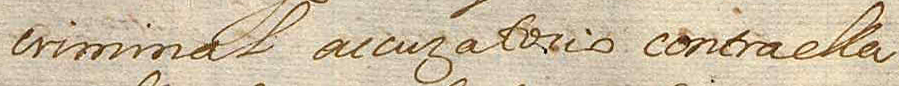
criminal accuzatorio contra ella
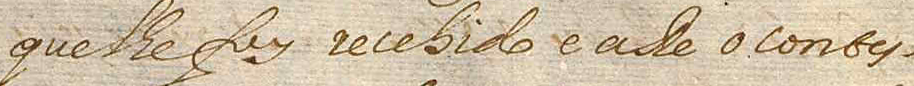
que lhe foy recebido e a Re o contes
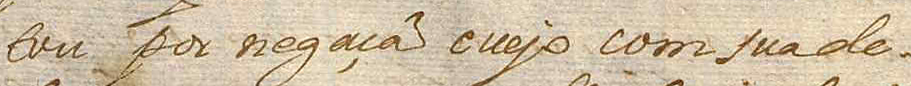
tou por negação e uejo com sua de
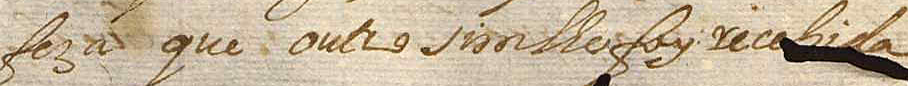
feza que outrosim lhe foy recebida
